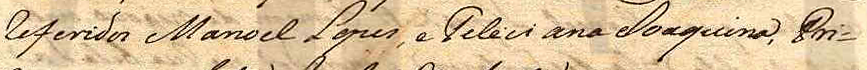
Referidos Manoel Lopes, e Feleciana Ioaquina, Pri
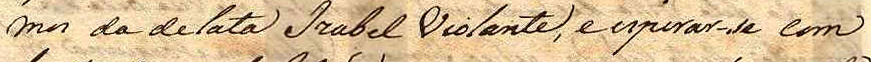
mos da delata Izabel Violante, e esperar-se com
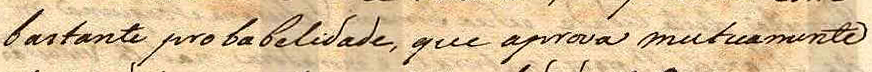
bastante probabelidade, que a prova mutuamente
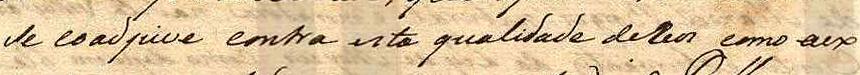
se coadjuice contra esta qualidade de Reos como a ex
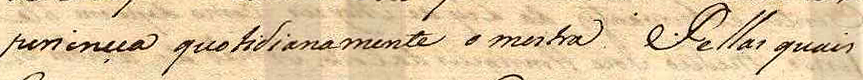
periencia quotidianamente o mostra Pellas quais
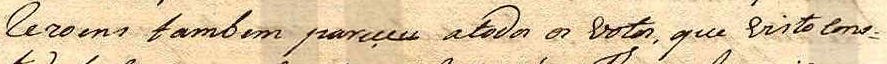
Rezoens tambem pareceu a todos os votos, que visto cons
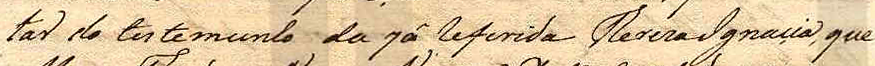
tar do testemunho da já Referida Thereza Ignacia, que
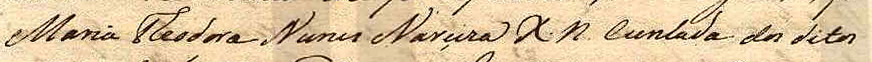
Maria Theodora Nunes Narciza x. n. cunhada dos ditos
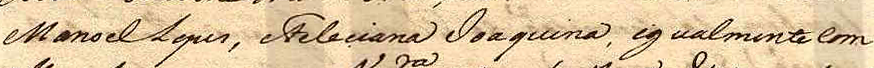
Manoel Lopes, e Feleciana Ioaquina, igualmente com
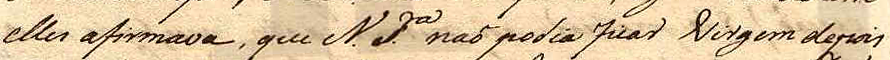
elles afirmava, que N. S.ra naõ podia ficar Virgem depois
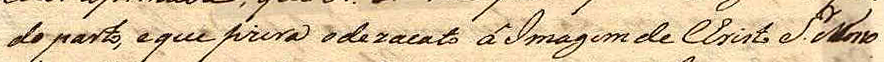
do parto, e que fizera o dezacato á Imagem de Christo S.r Nosso
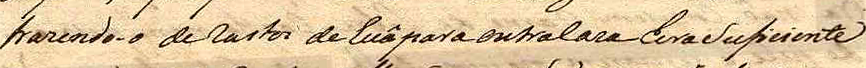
trazendo-o de Rastos de huā para outra caza hera suficiente
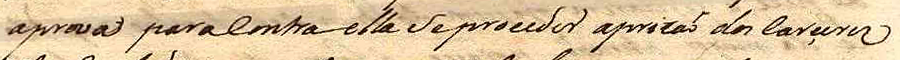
a prova para contra ella se proceder a prizaõ dos carceres
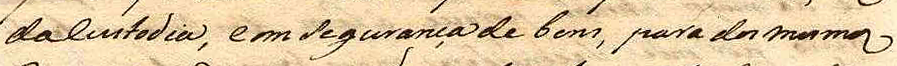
da custodia, com segurança de bens, para dos mesmos
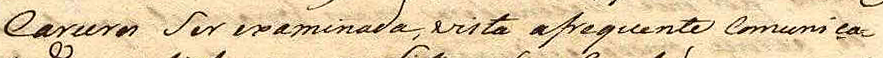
Carceres Ser examinada, vista a frequente comunica
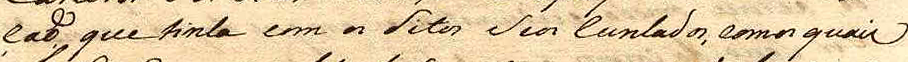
çaõ, que tinha com os ditos seos Cunhados, com os quais
